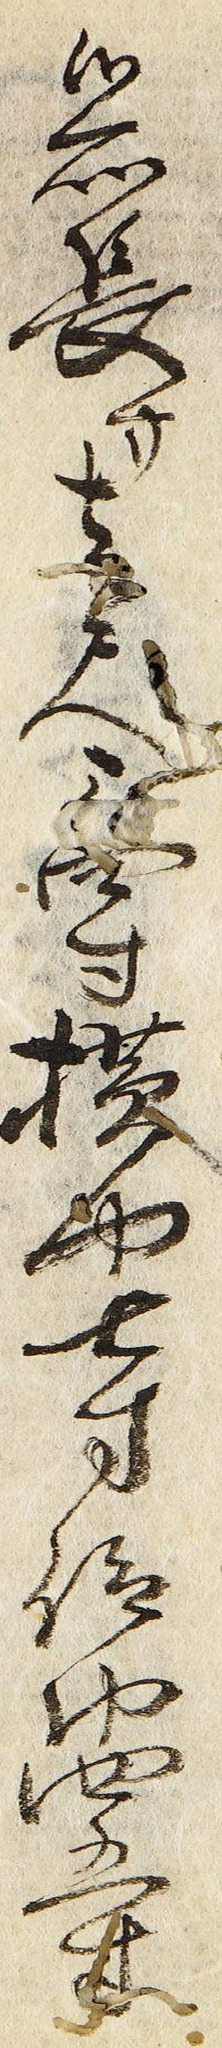候所長サ壱尺三四寸横幅七寸縦幅四五寸
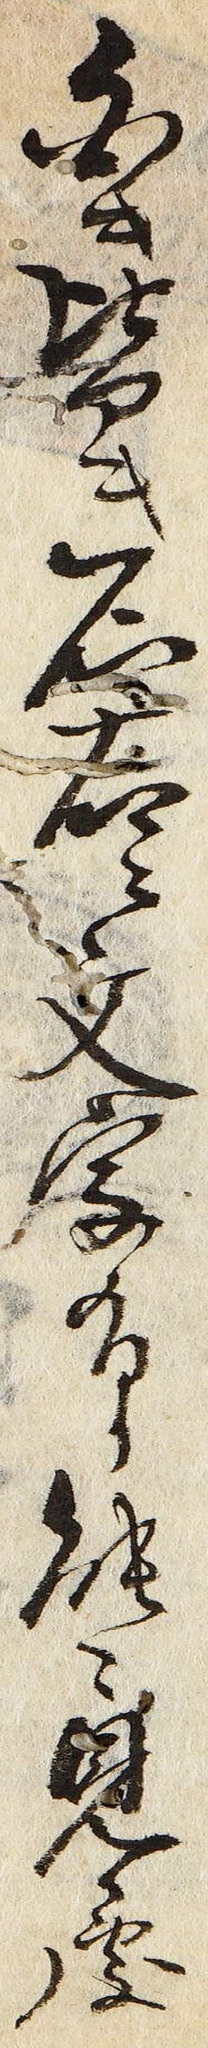白キ皆キ石右ニ文字有り能々見候処
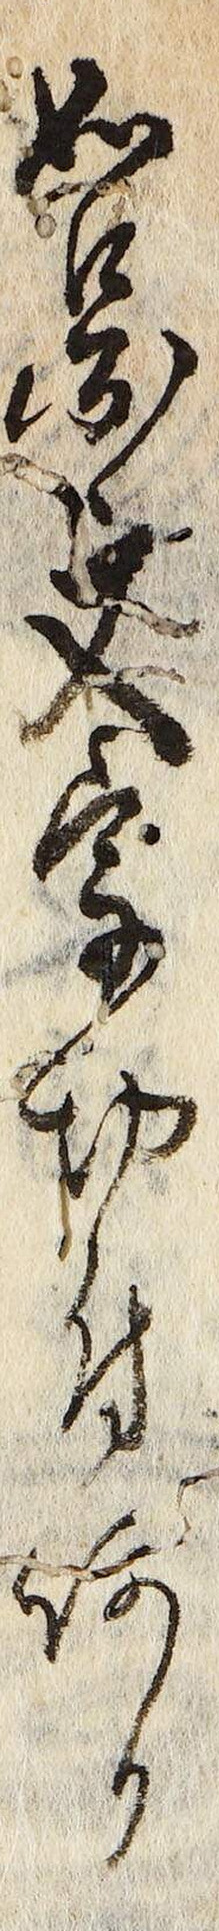如図文字切付あり
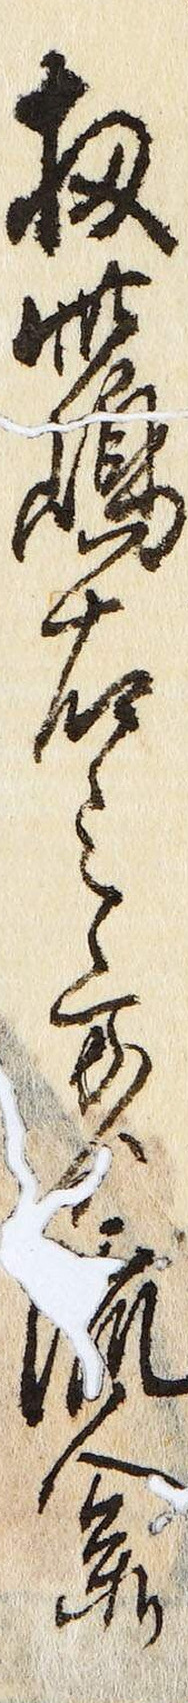扨此嶋右之方ゟ流人参り
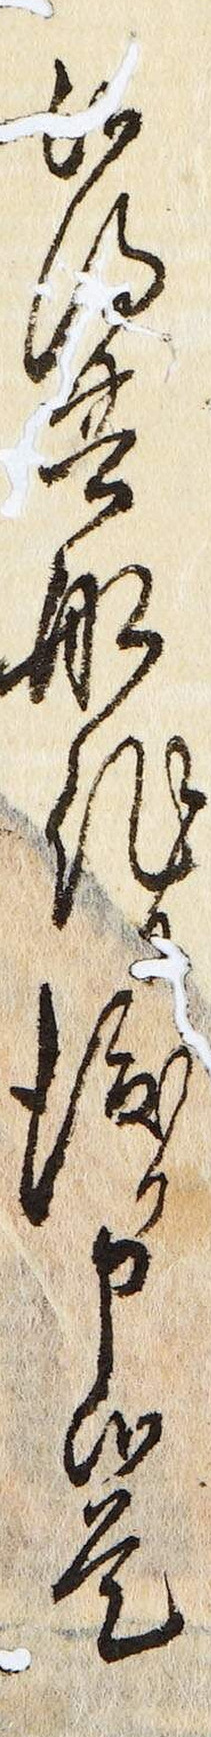候得共船作り渡り申候是
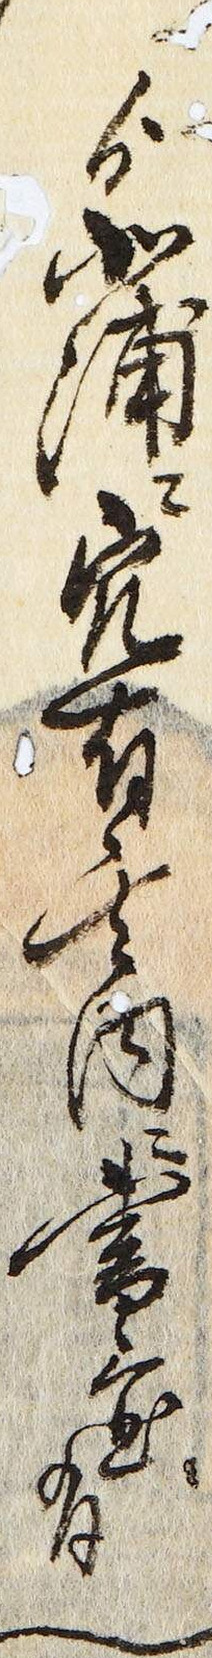ゟ北浦ニ穴有其内ニ書置有
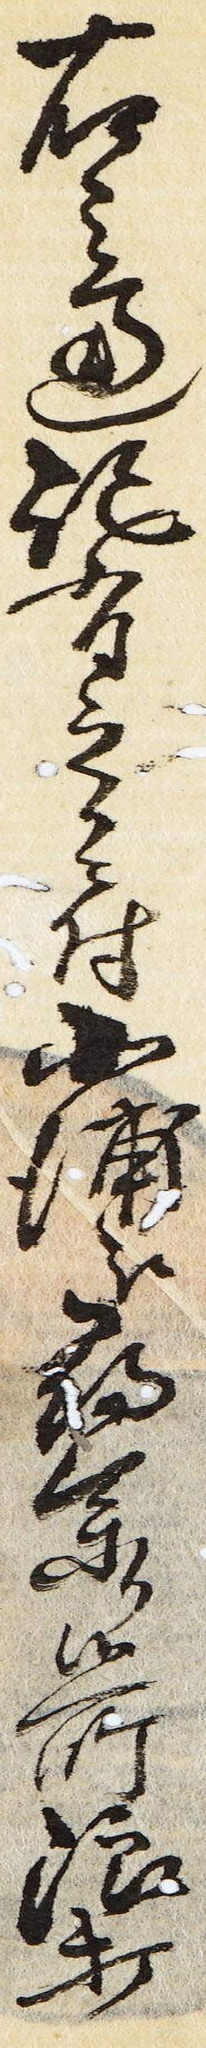右之通記有之候ニ付北浦え尋参り候所浪打
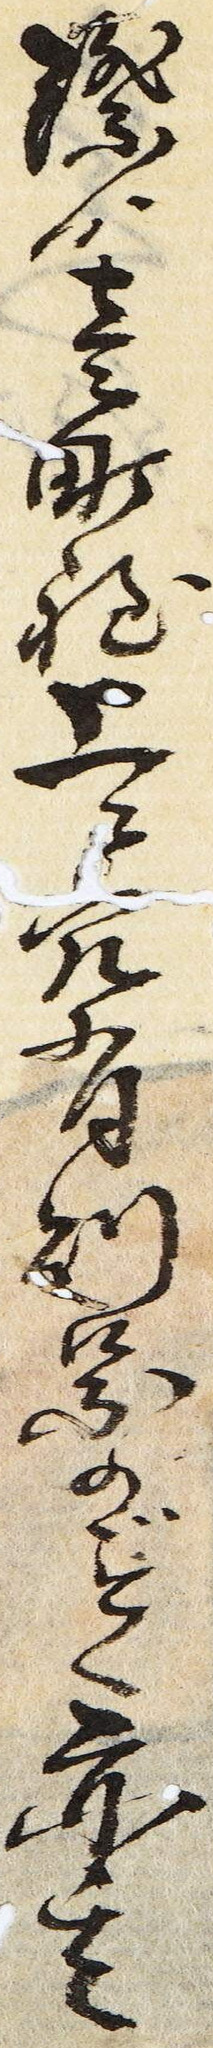際ゟ壱町程上ニ穴有別図のごとく亦其
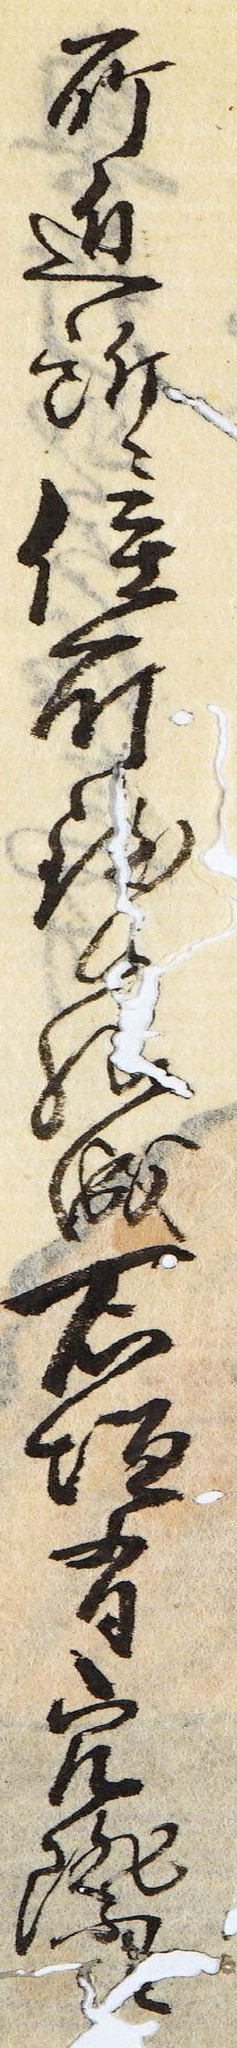所近所ニ住所致候様成石垣有穴際ニ
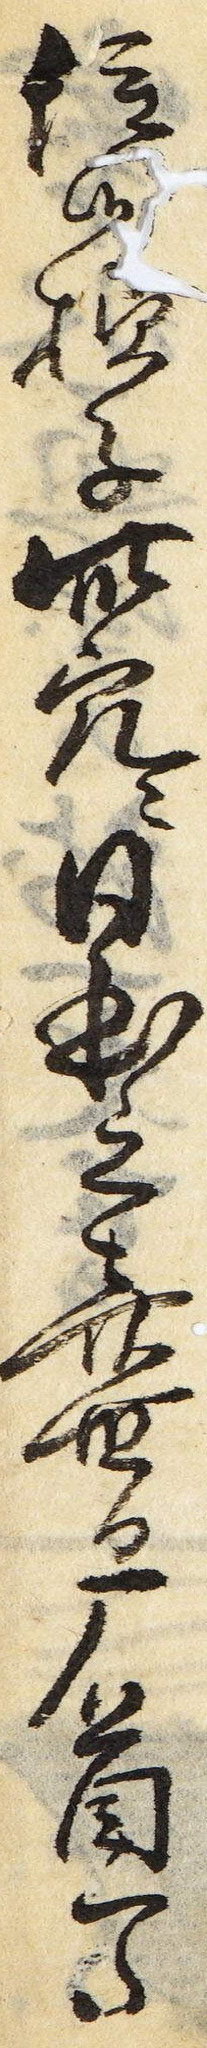住候様子此穴ニ日本之喜世る雁首一ツ

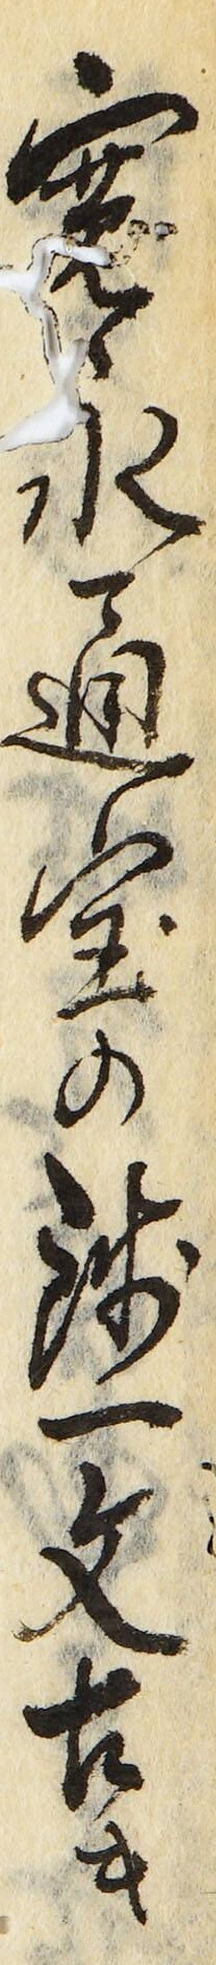寛永通宝の銭一文古キ
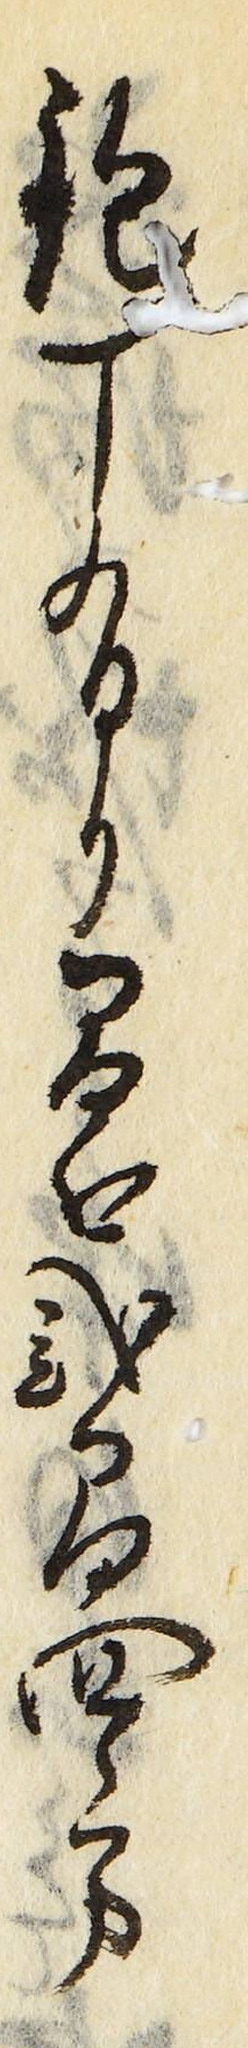鉋丁有り間口弐間四方
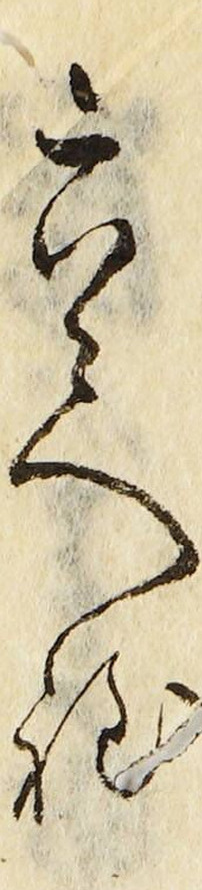六尺程
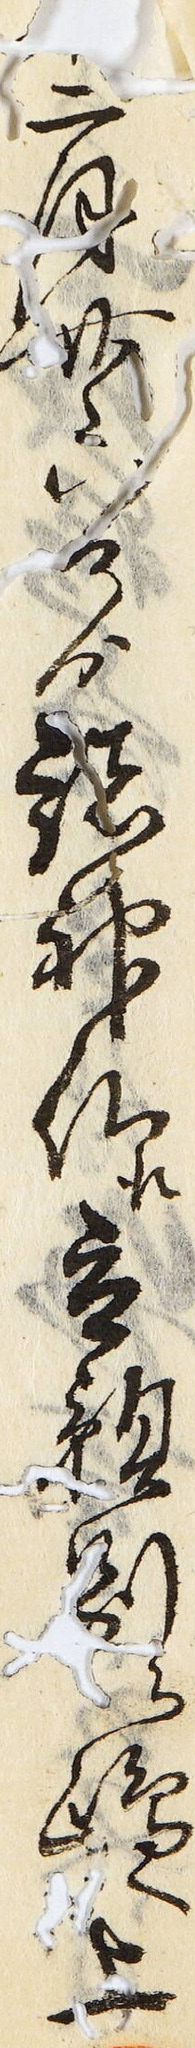二月廿六日ゟ諸神仏え立願別而嶋へ上
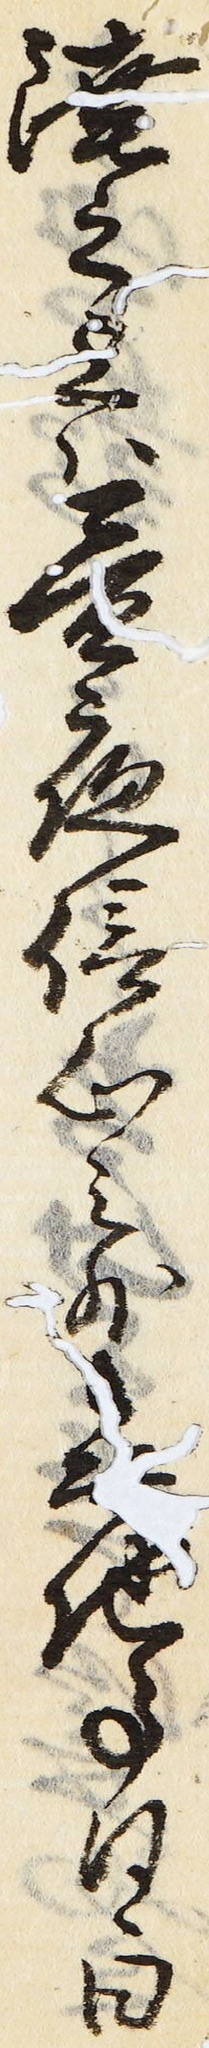陸之上ハ昼夜信心之外無他事日々日
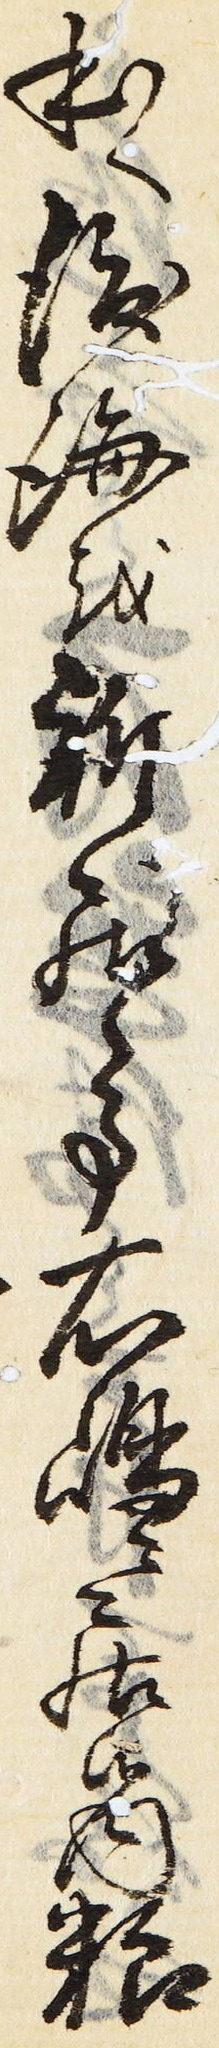本へ渡海を祈居候事右嶋ニ居候内粮
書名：阿波幸宝丸漂流記
